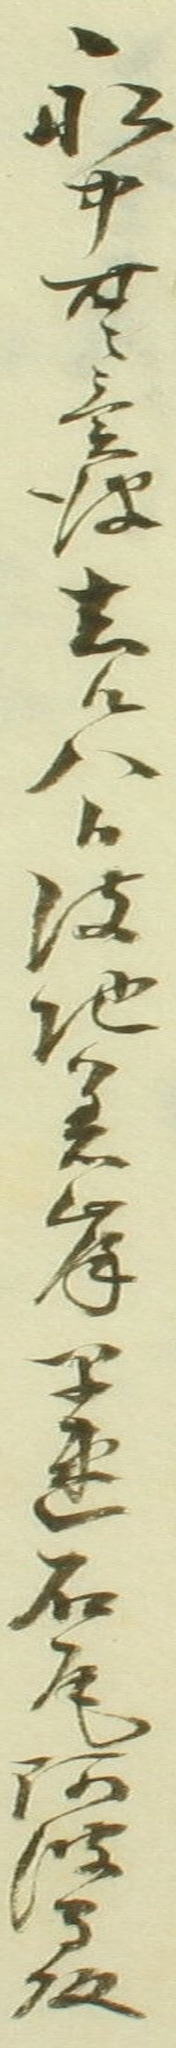船中無異儀去ル八日波地着岸早速石尾阿波守殿
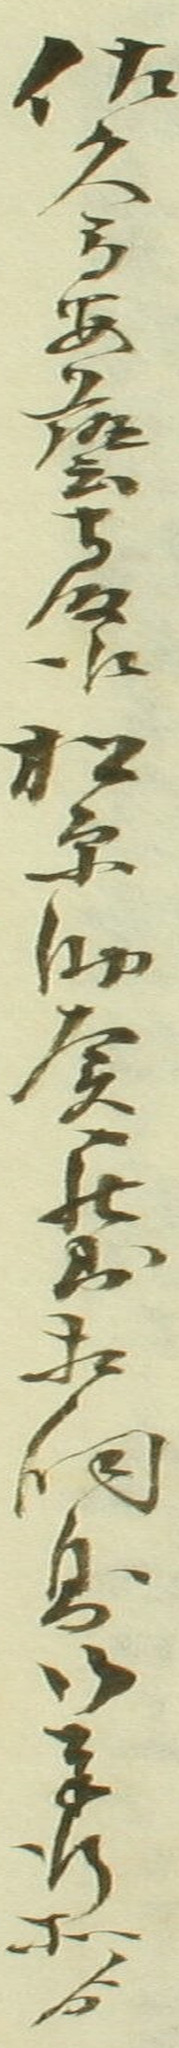佐久間安芸守殿江松原助大夫罷出相伺則御奉行所ゟ
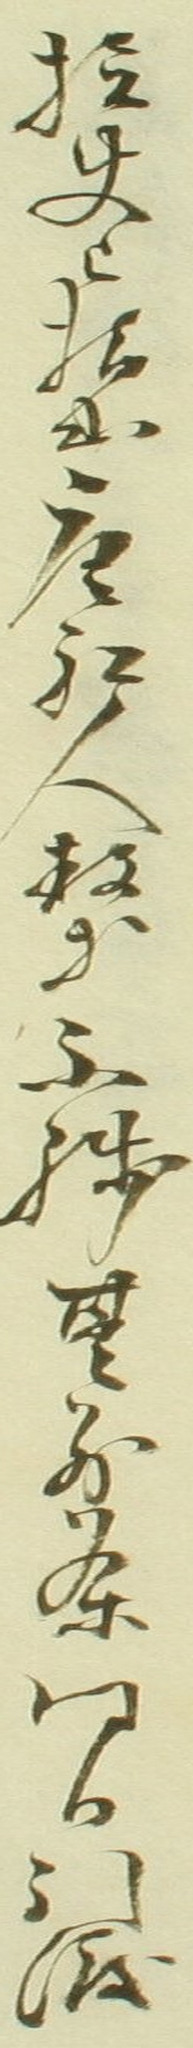検使被指出唐船人数等不残無別条同日引渡
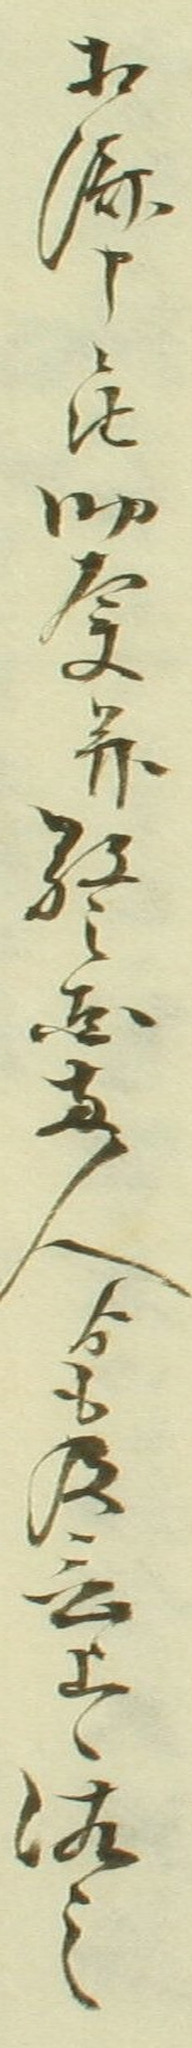相済申候由助大夫并警固両人ゟも及言上候依之
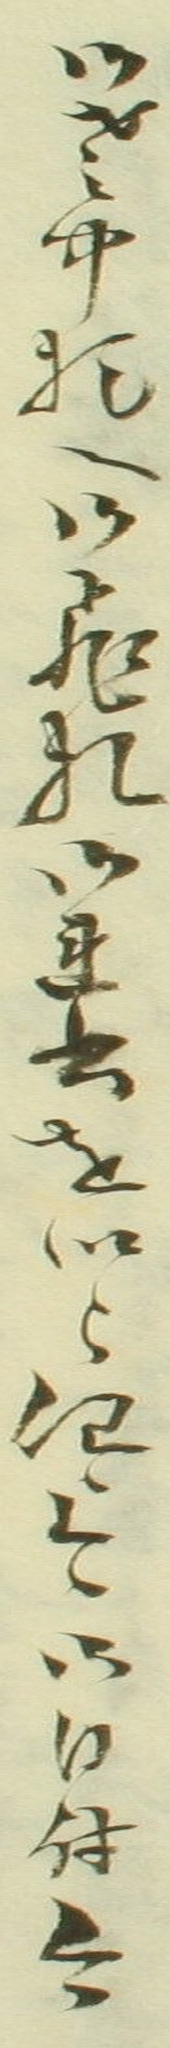御老中様へ御飛札御連書を以被仰上候御日付今
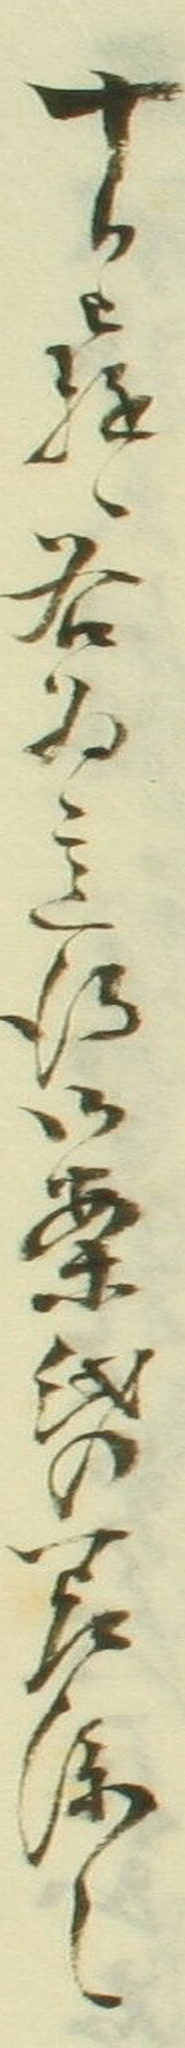十日被遊候右為意得御案紙差添候
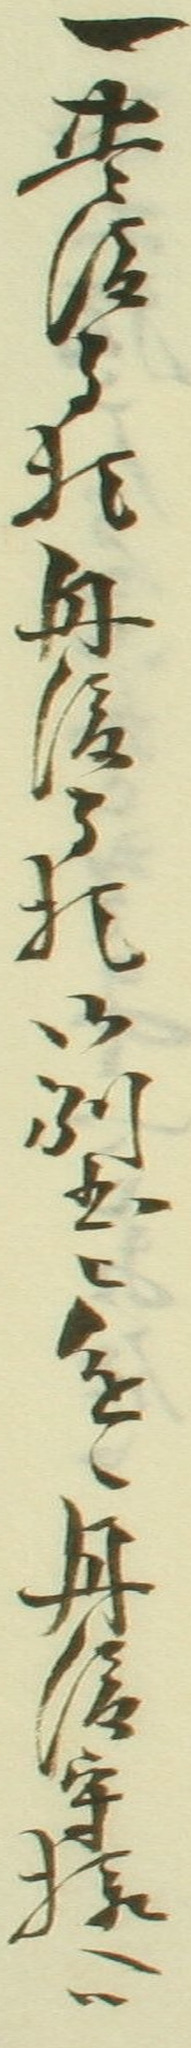一豊後守様丹後守様御別書被進候丹後守様へハ
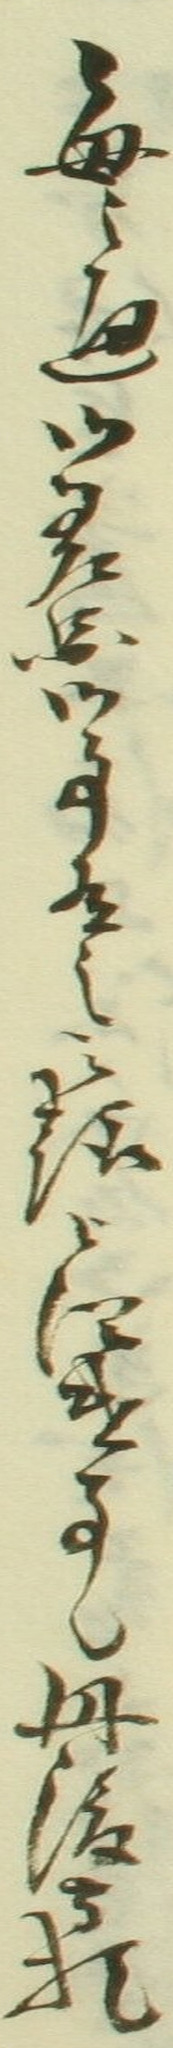毎之通御差図御事有之之趣被仰遣事候丹後守様
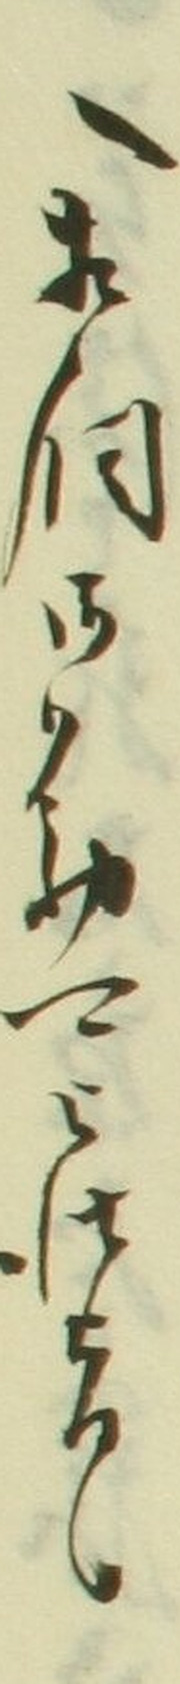へ相伺御勤可被仕旨候

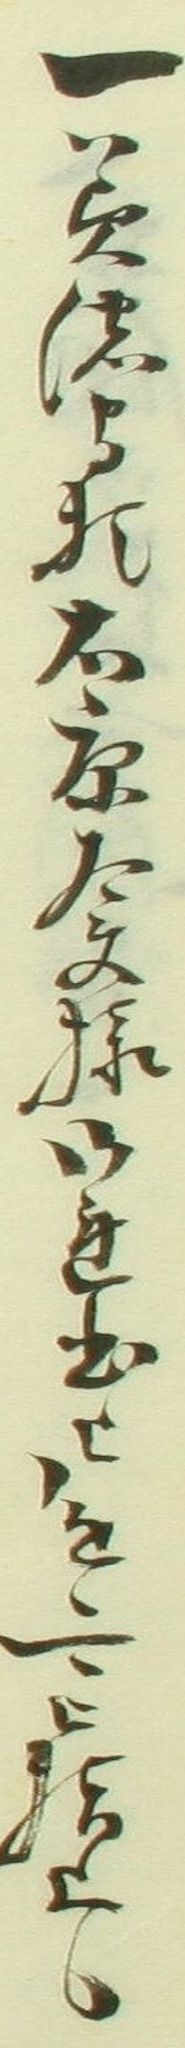一美濃守様右京大夫様御連書被進候可被指上候
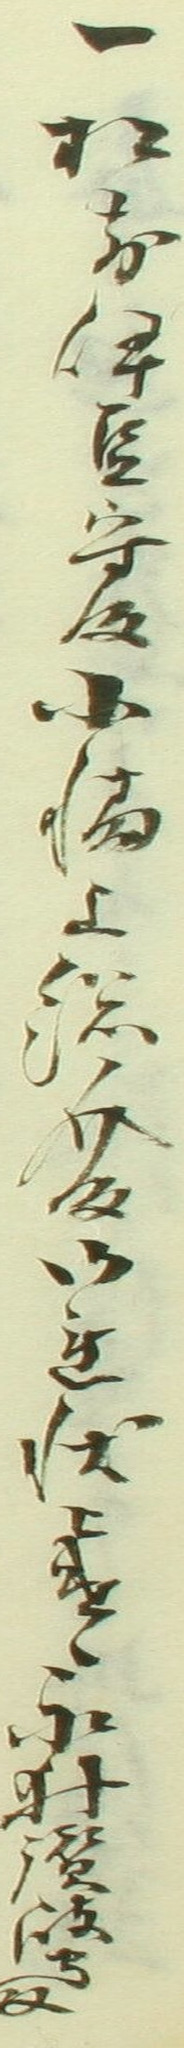一松前伊豆守殿小幡上総介殿御連状被遣候永井讃岐守殿
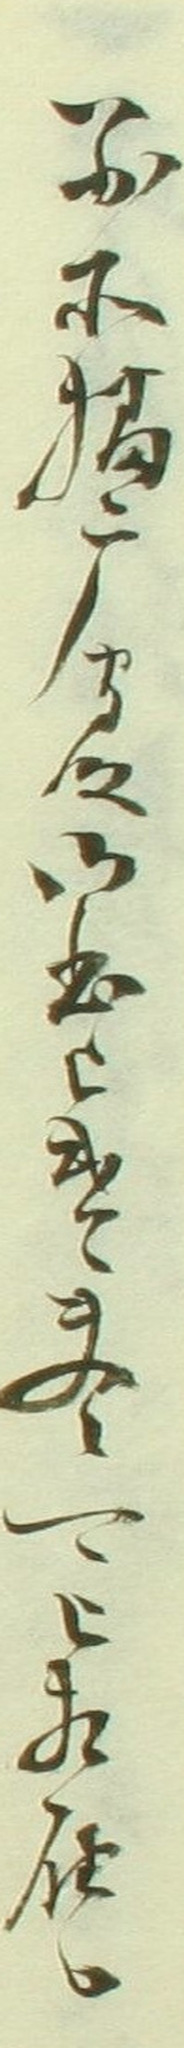別所播磨守殿御書被遣候夫々可被相届候
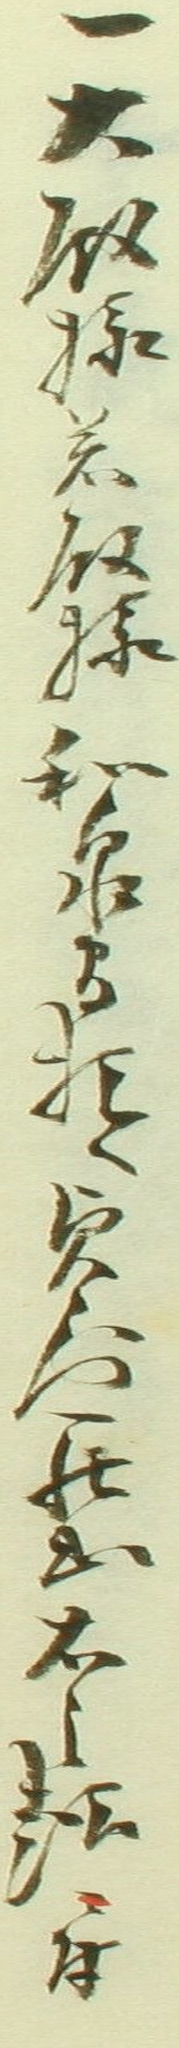一大殿様若殿様和泉守様へ貞右衛門罷出右之趣ニ付
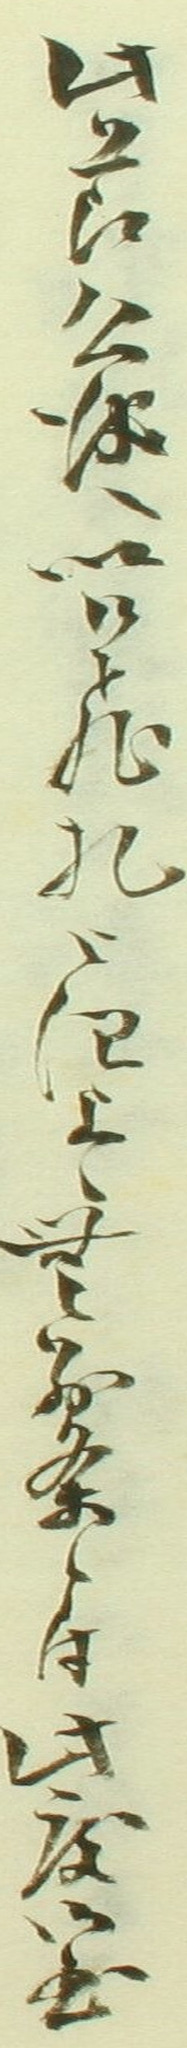此節公儀へ以御飛札被仰上候無別条候付此度御書
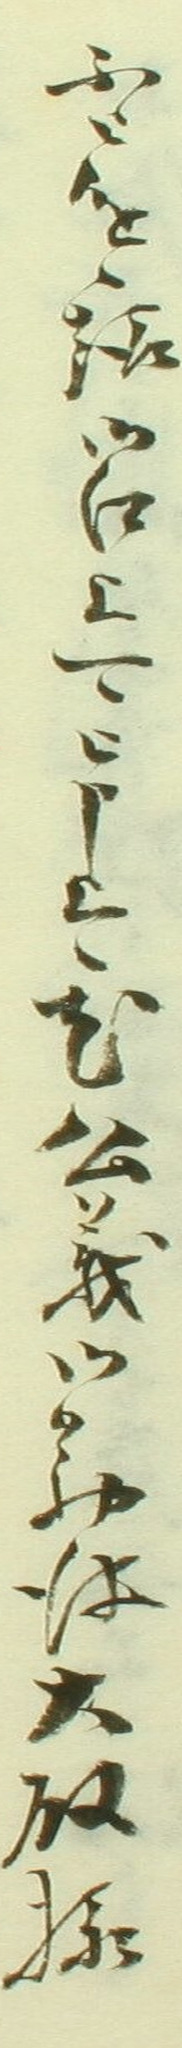不被進候趣御口上可被申上候尤公義御勤儀大殿様
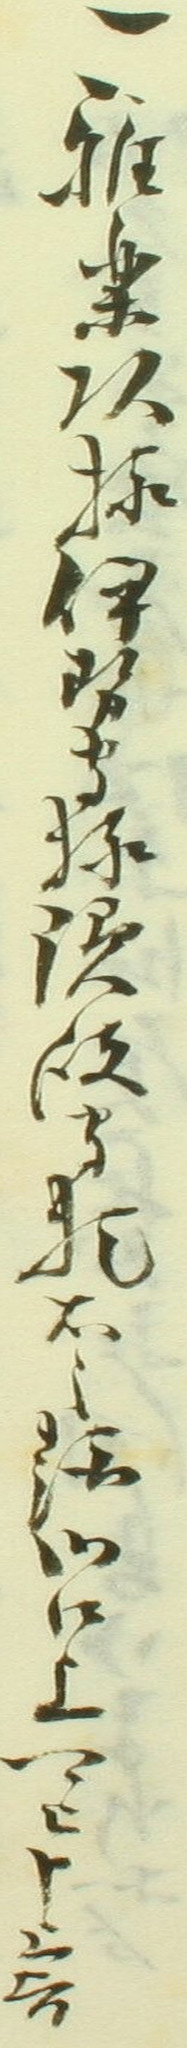一雅楽頭様伊勢守様隠岐守様右之趣御口上可被申上旨
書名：異国船漂着記
